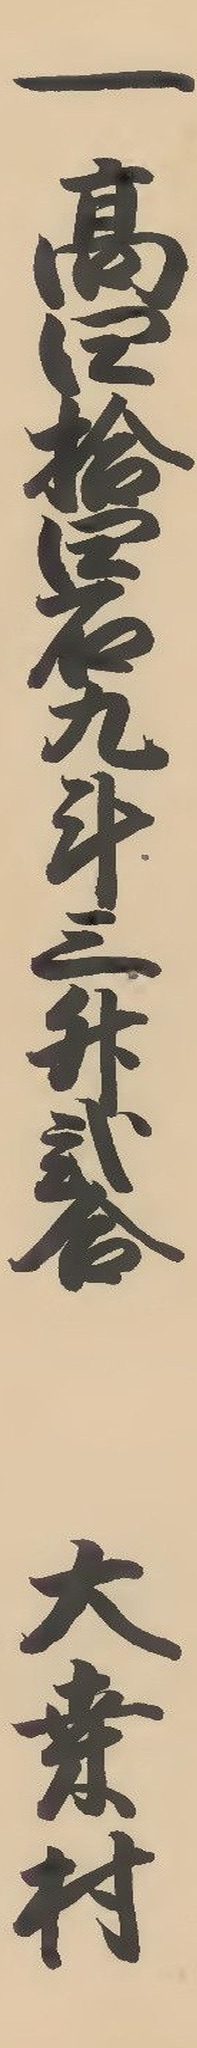一高四拾四石九斗三升弐合大桑村
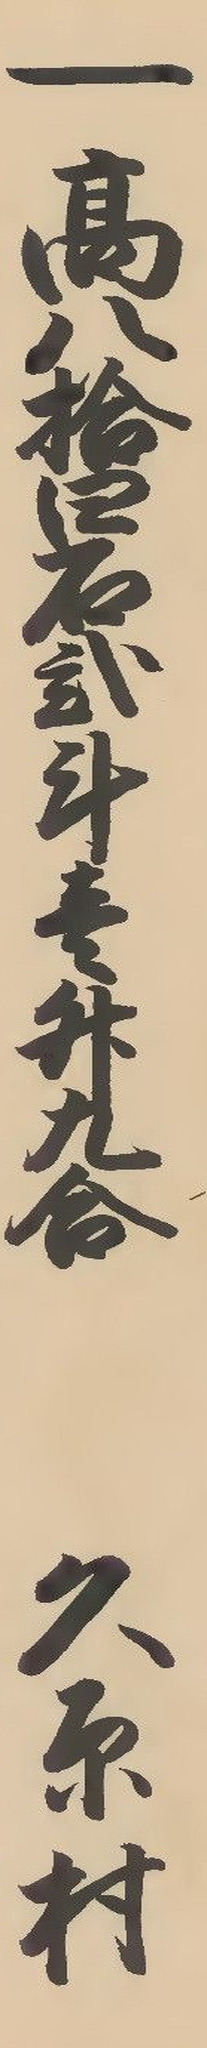一高八拾四石弐斗壱升九合久原村
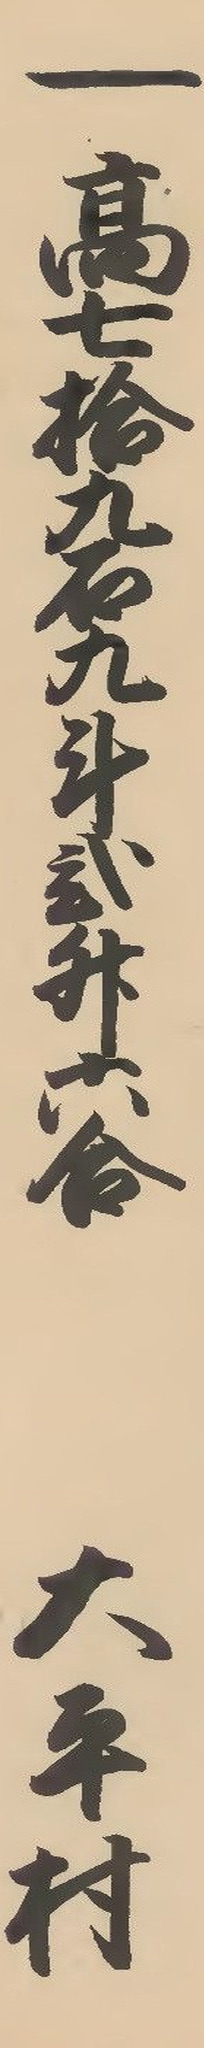一高七拾九石九斗弐升六合大平村
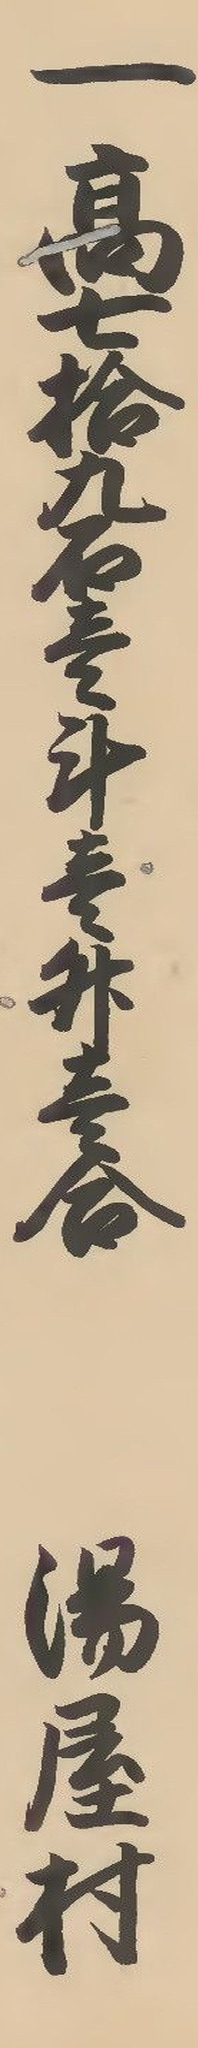一高七拾九石壱斗壱升壱合湯屋村
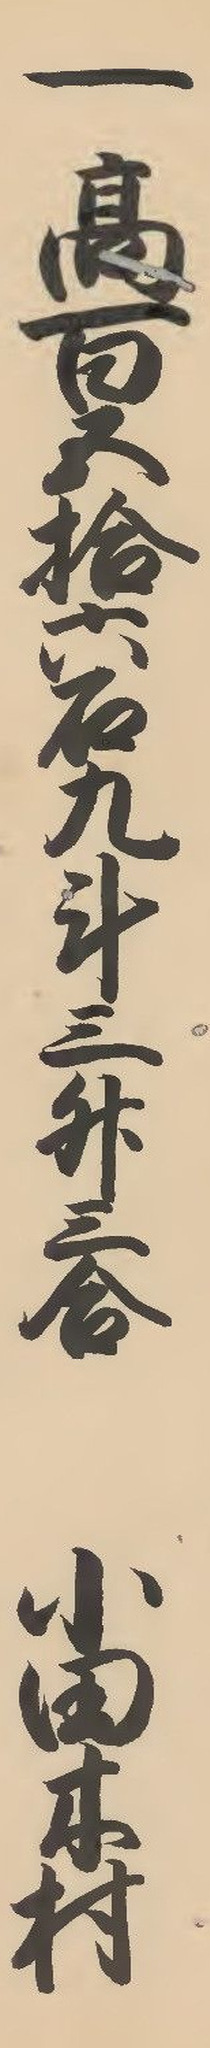一高百五拾六石九斗三升三合小田木村
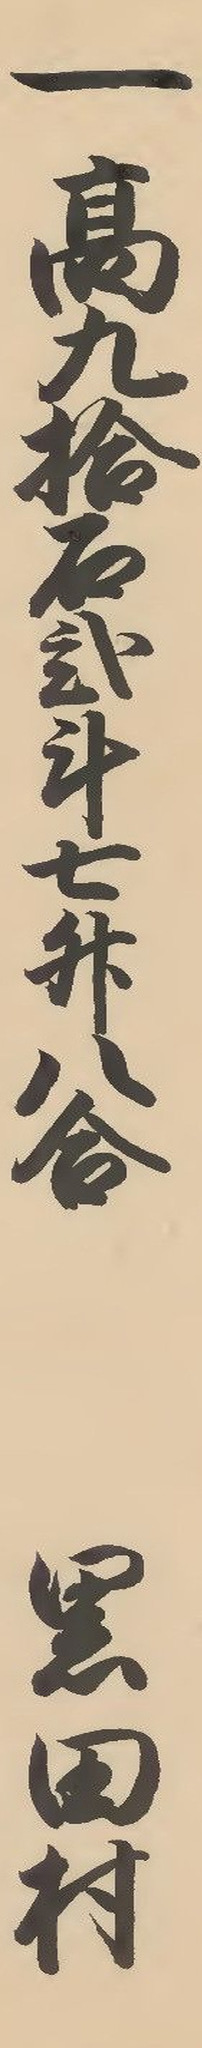一高九拾石弐斗七升八合黒田村
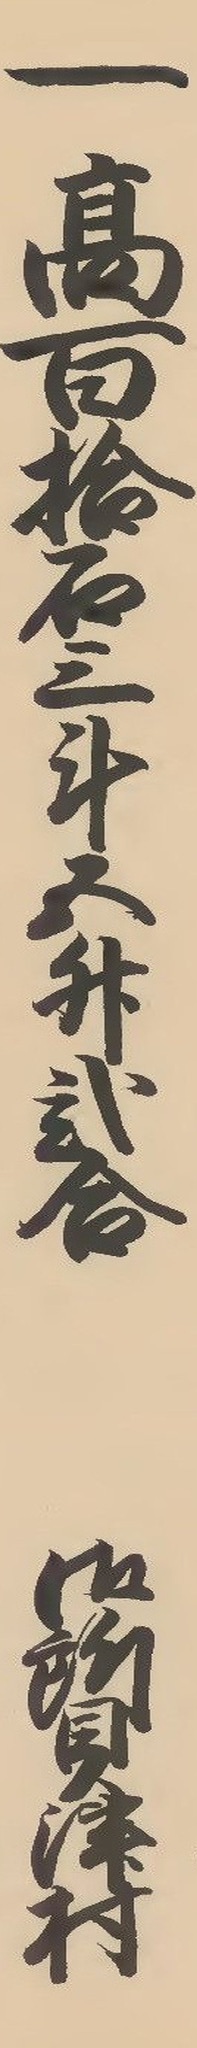一高百拾石三斗五升弐合御所貝津村
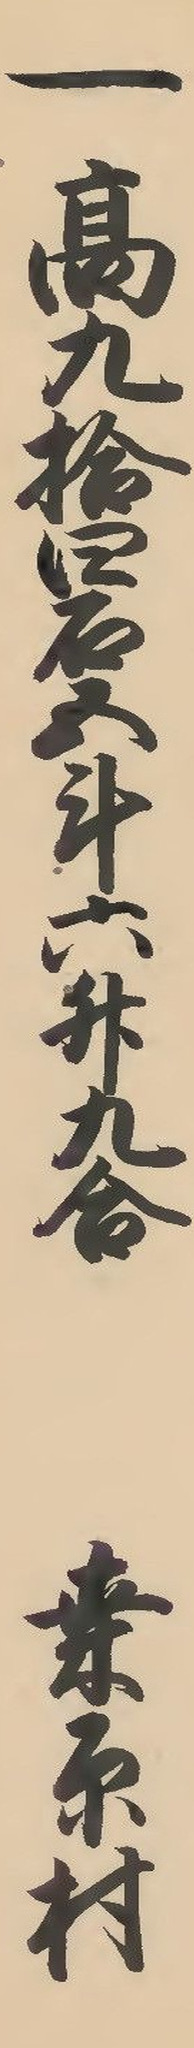一高九拾四石五斗六升九合桑原村

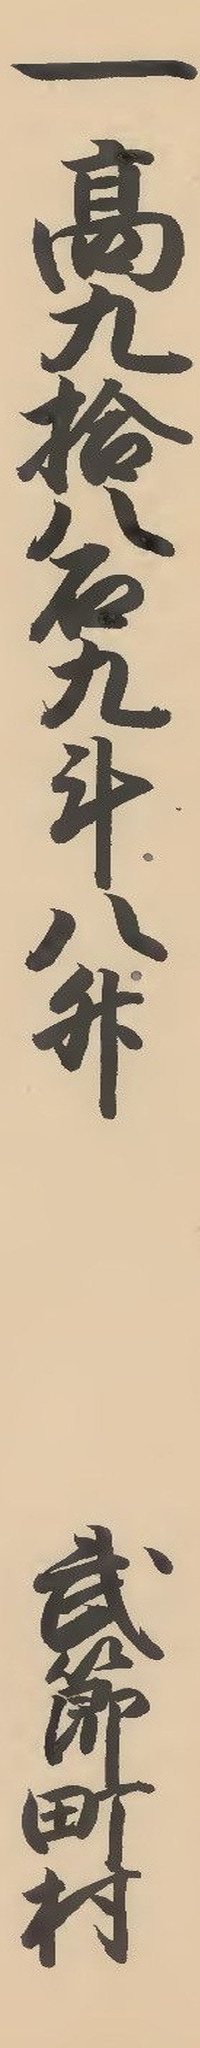一高九拾八石九斗八升武節町村
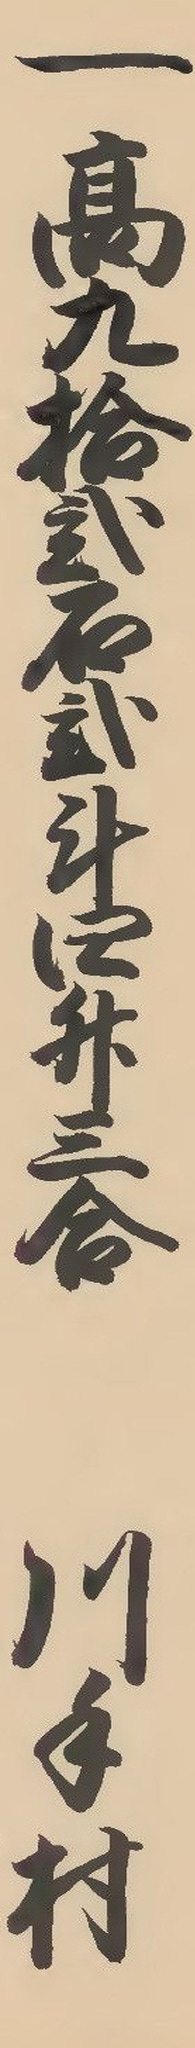一高九拾弐石弐斗四升三合川手村
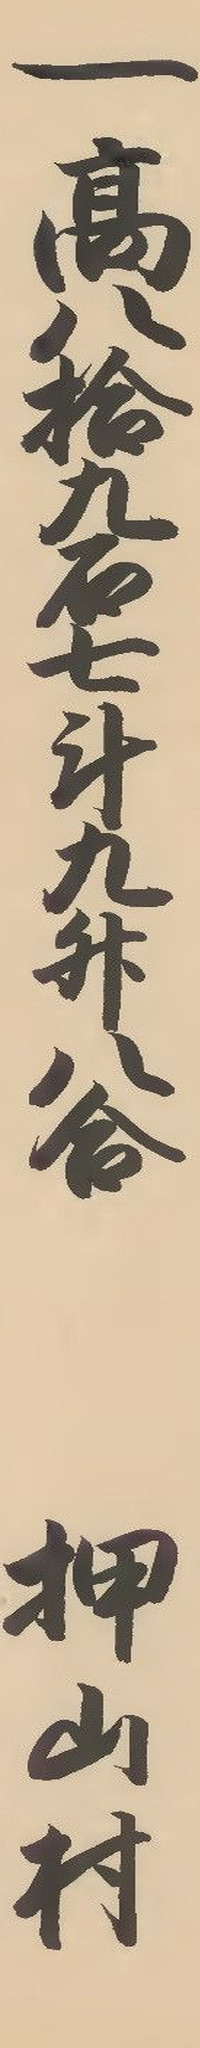一高八拾九石七斗九升八合押山村
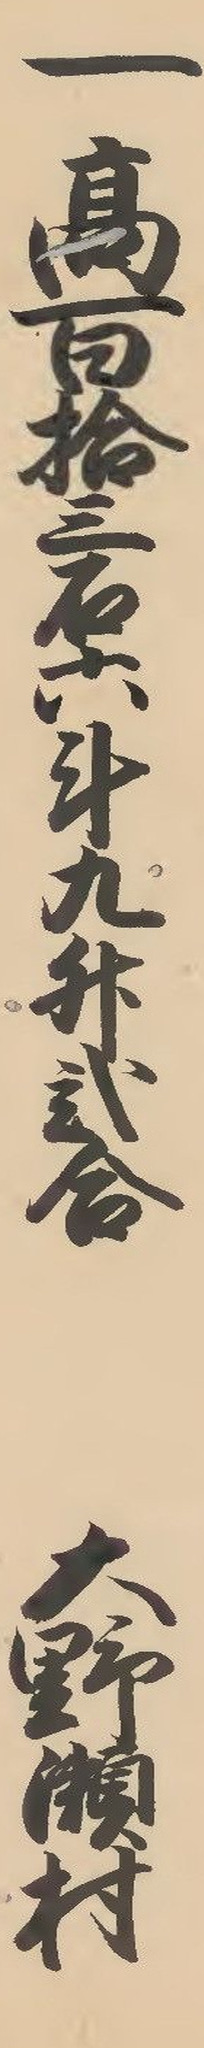一高百拾三石六斗九升弐合大野瀬村
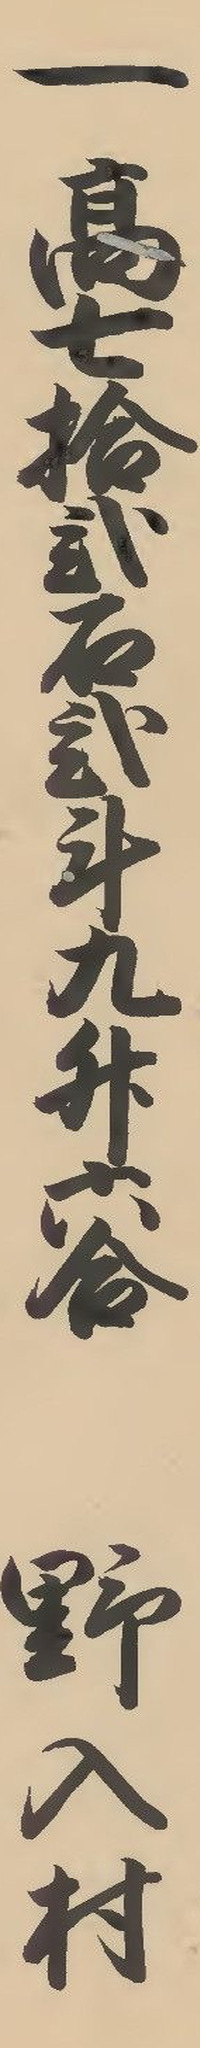一高七拾弐石弐斗九升六合野入村
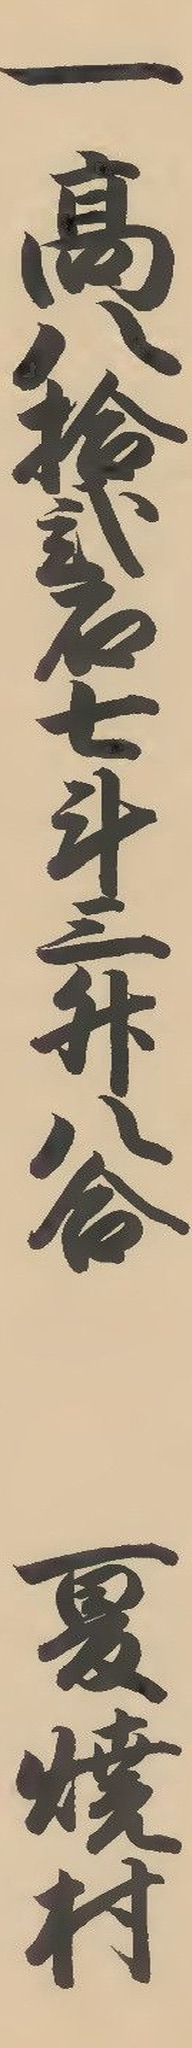一高八拾弐石七斗三升八合夏焼村
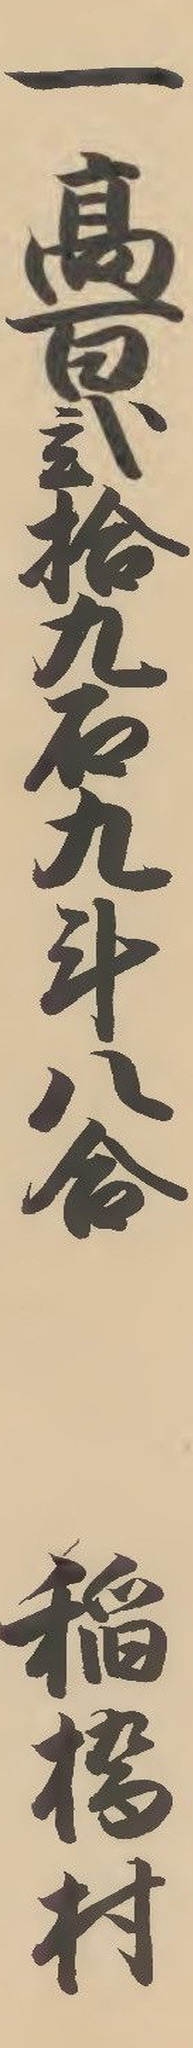一高百弐拾九石九斗八合稲橋村
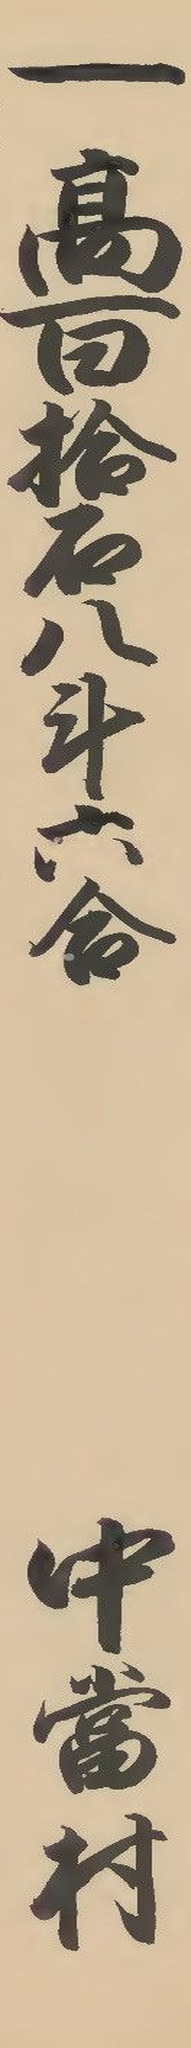一高百拾石八斗六合中当村
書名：三河国郷帳
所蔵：国立公文書館 National Archives of Japan
